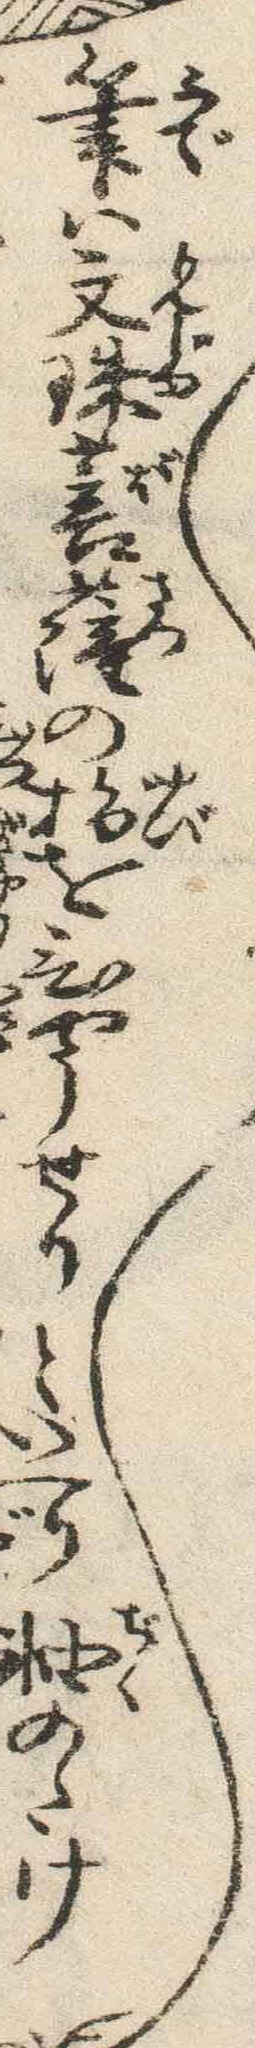筆は文殊菩薩の指をひやうせりといへり軸のたけ
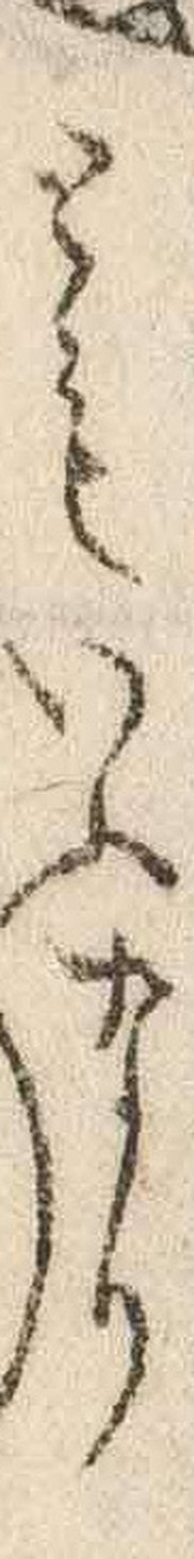ともいふなり
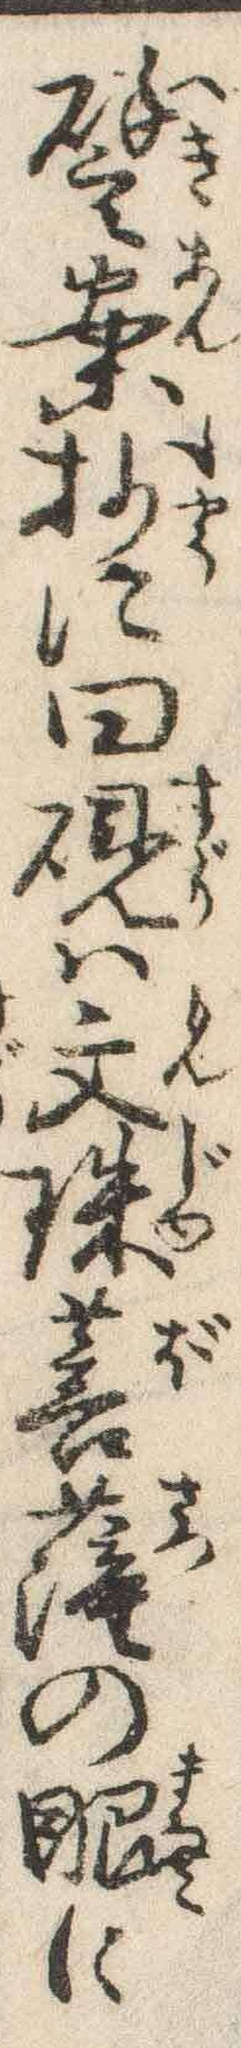譬案抄に曰硯は文珠菩薩の眼に
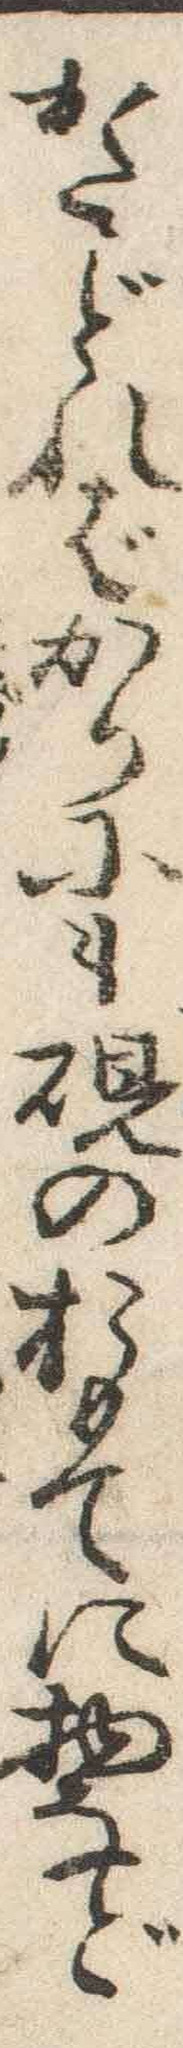かたどればかりにも硯のおもてに物など
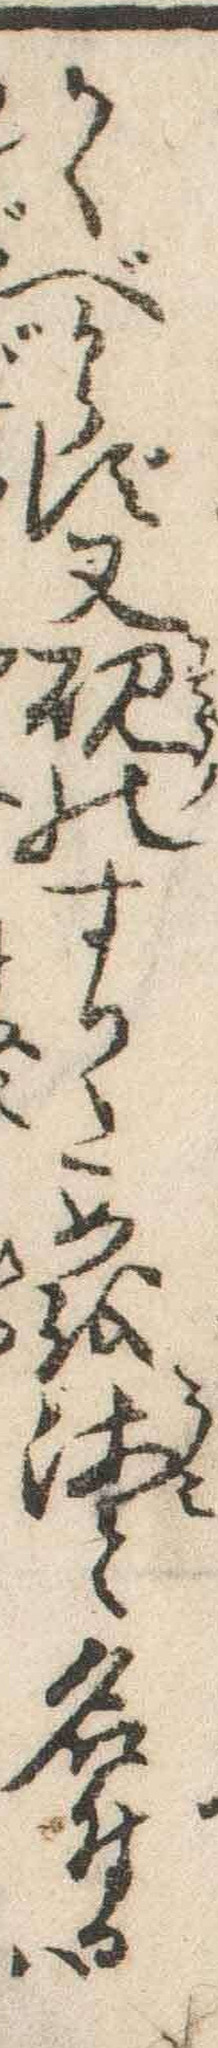かくべからず又硯のすりためを海と名付るは
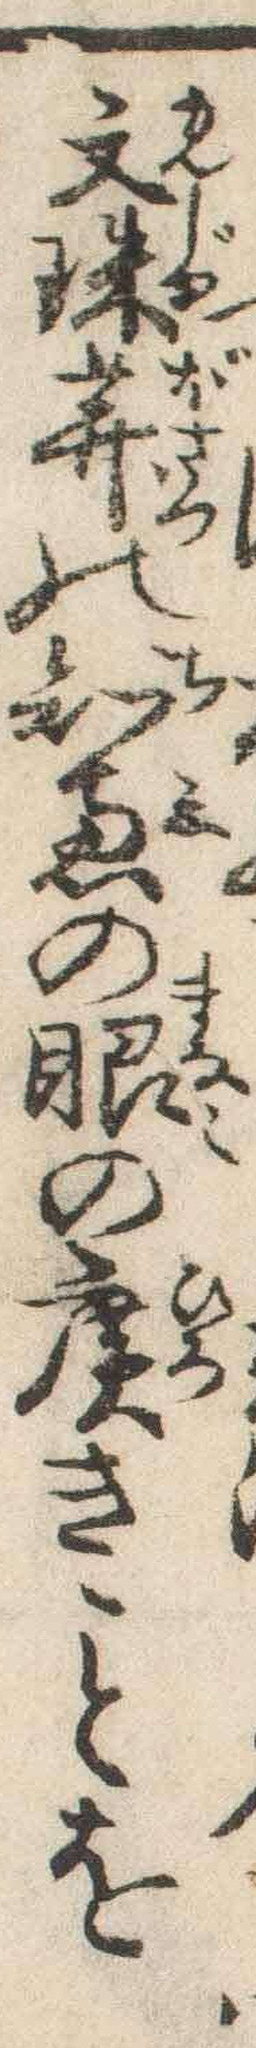文珠菩薩の智恵の眼の広きことを
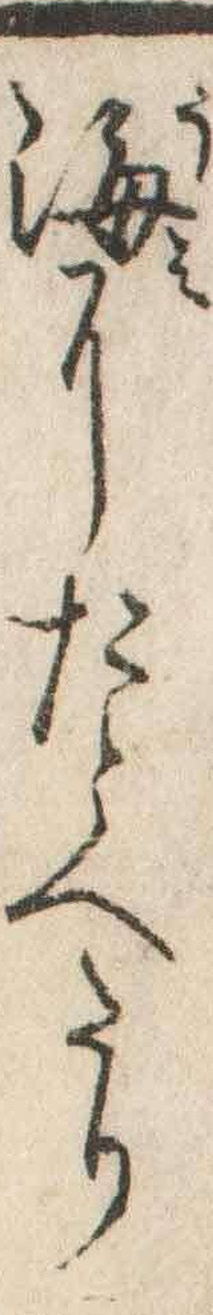海にたとへたり
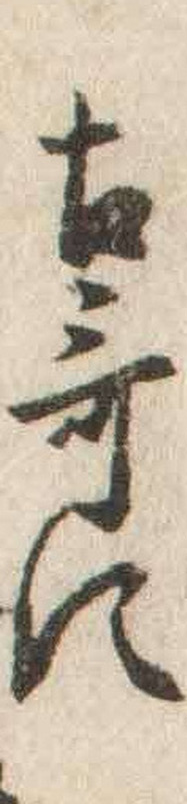古哥に
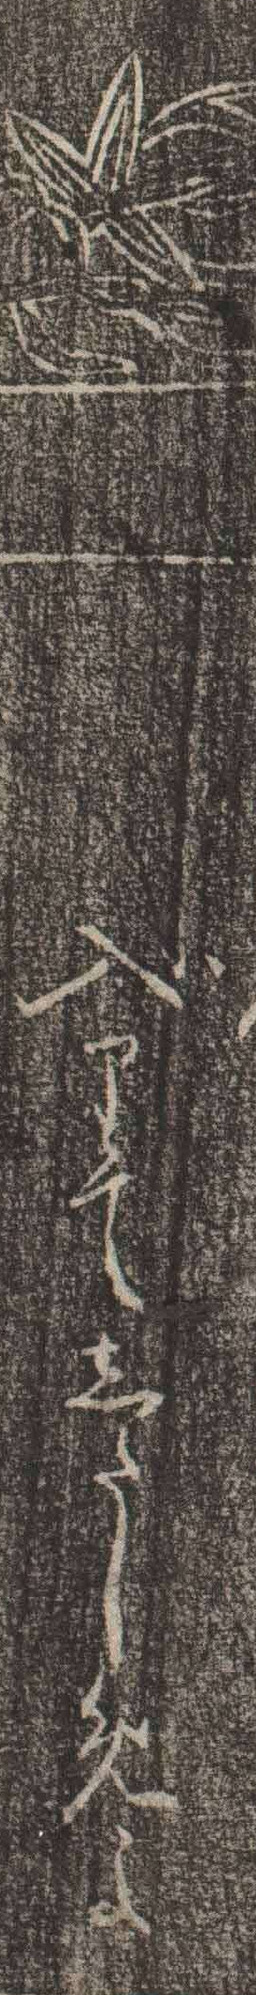入りてしたしめよ
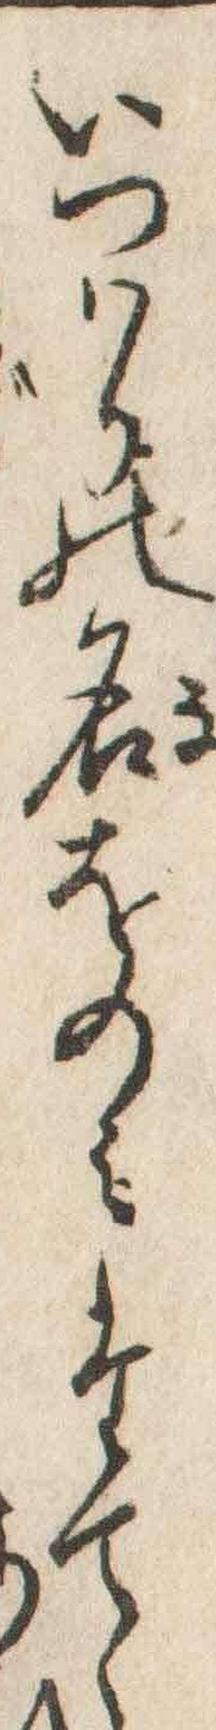いつわりの名をのみたてゝ
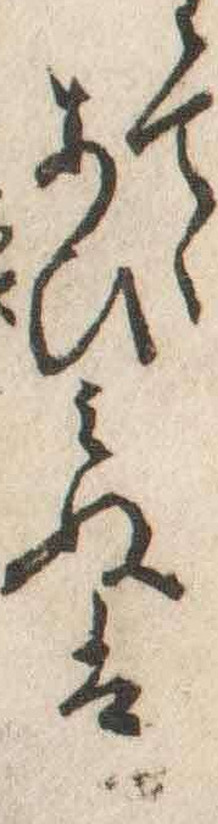あひみぬは
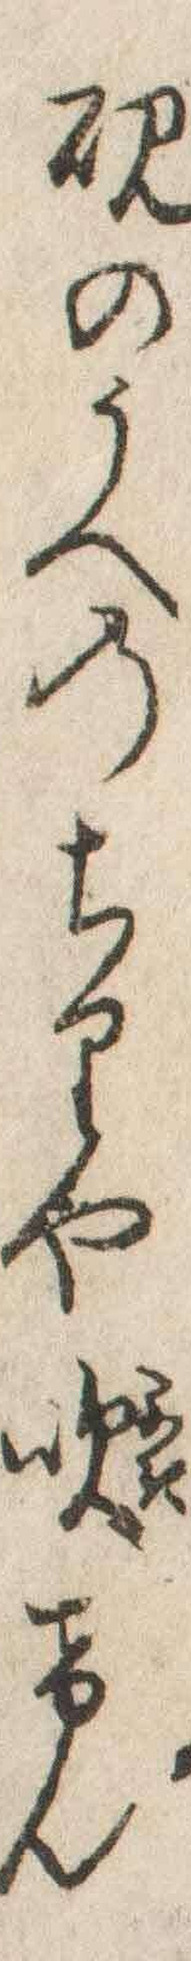硯のうへのちりや吹けん
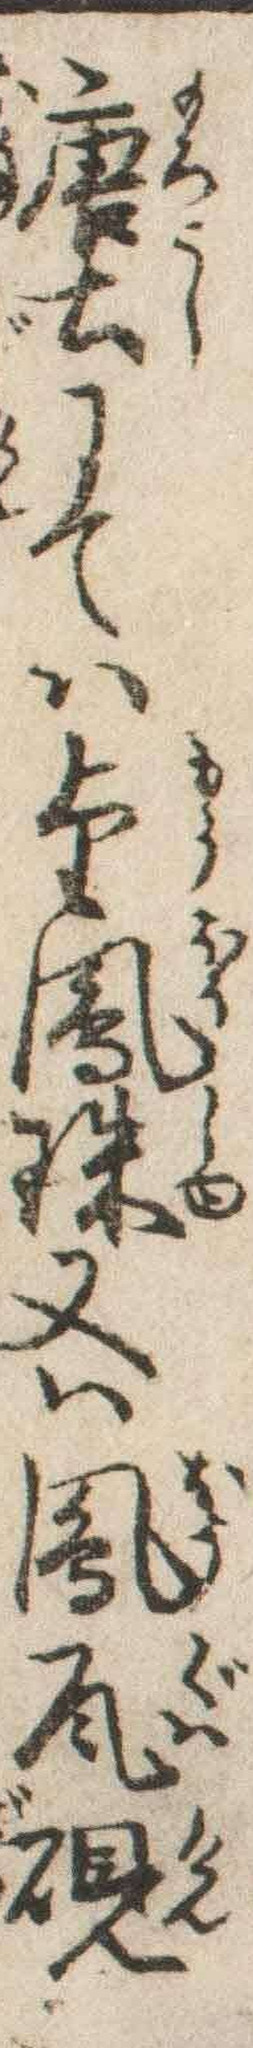唐土にては望鳳珠又は鳳瓦硯
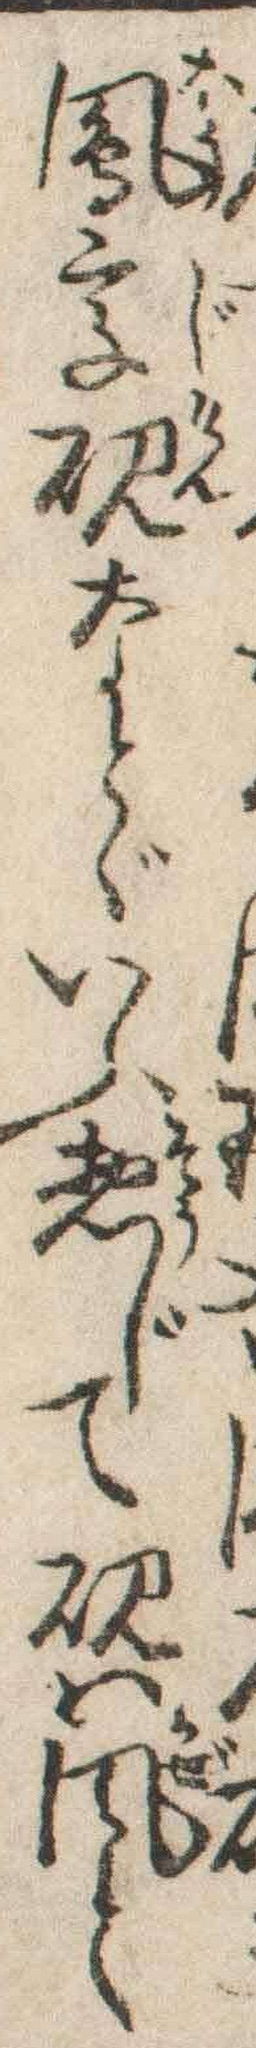鳳字硯なとゞいふ惣じて硯は風と
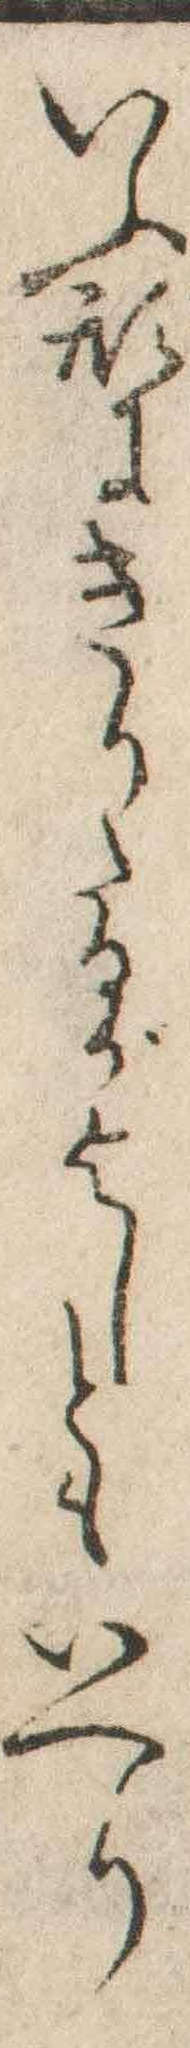いふ形にきりたるがよしともいへり

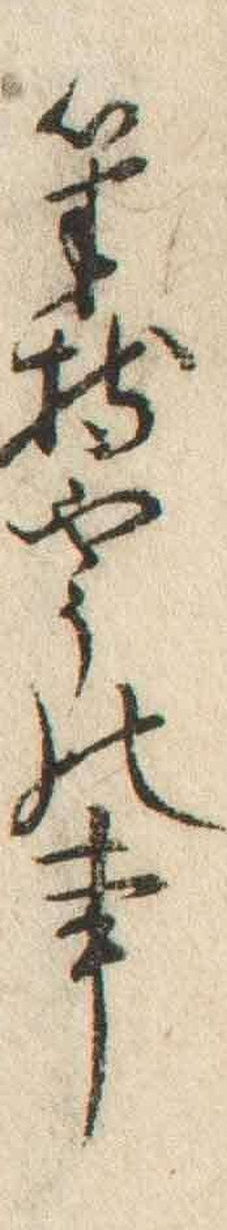筆持やうの事
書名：撫育草
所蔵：東京学芸大学附属図書館 国文学研究資料館
